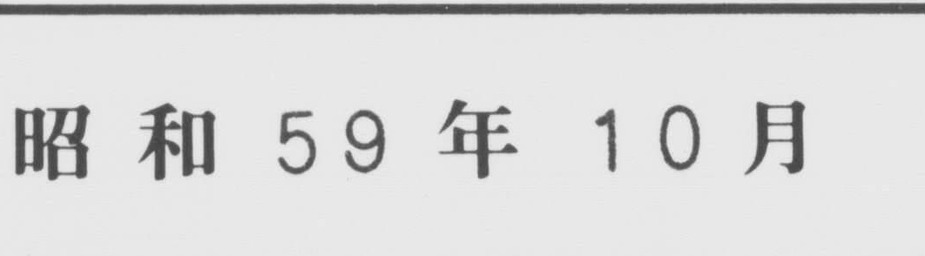昭和年月
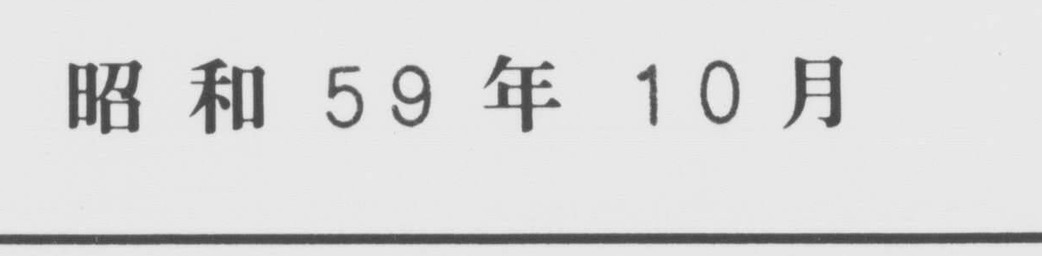昭和年月
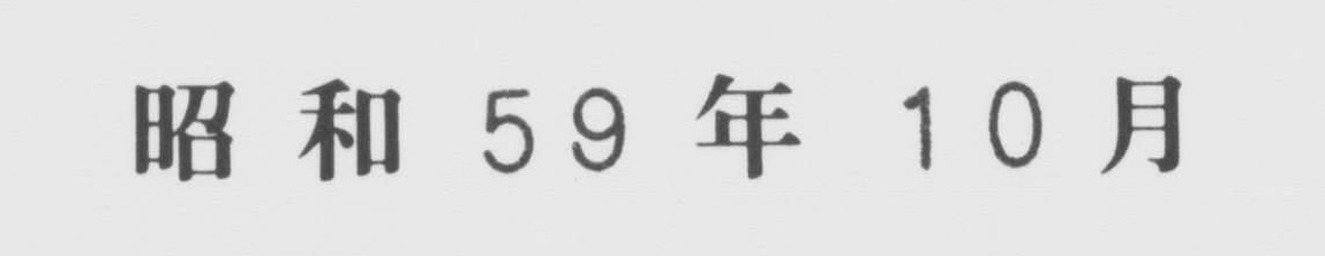昭和年月
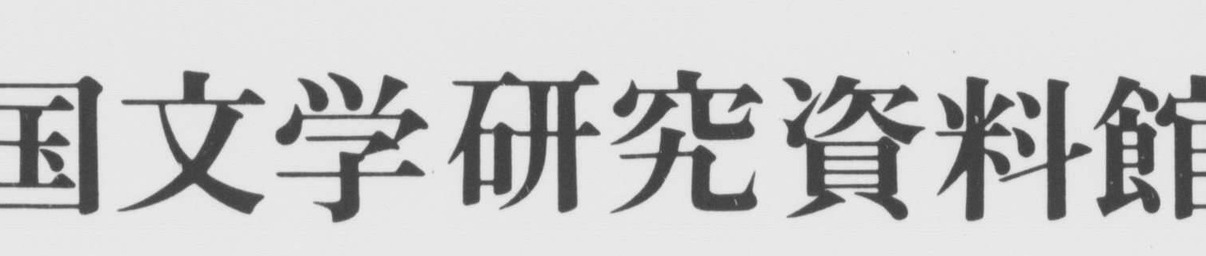国文学研究資料館
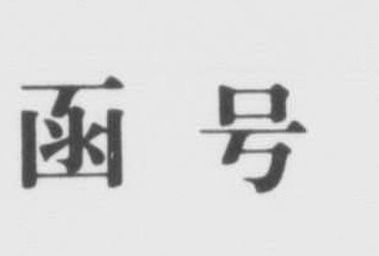函号-

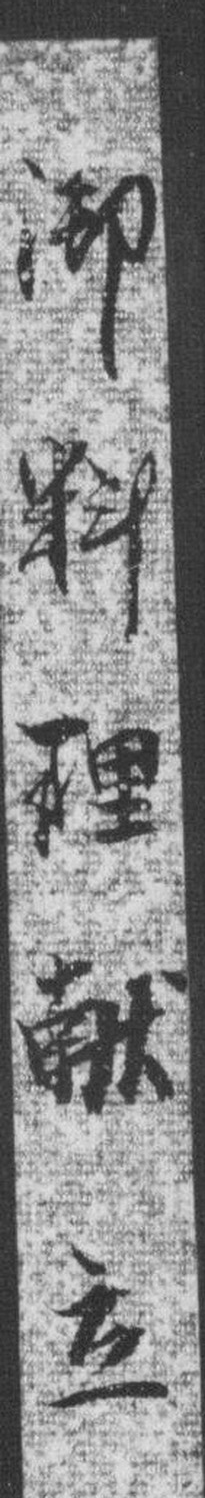御料理献立
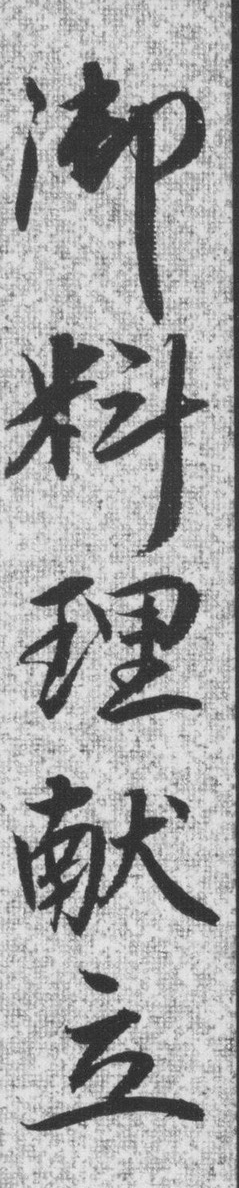御料理献立

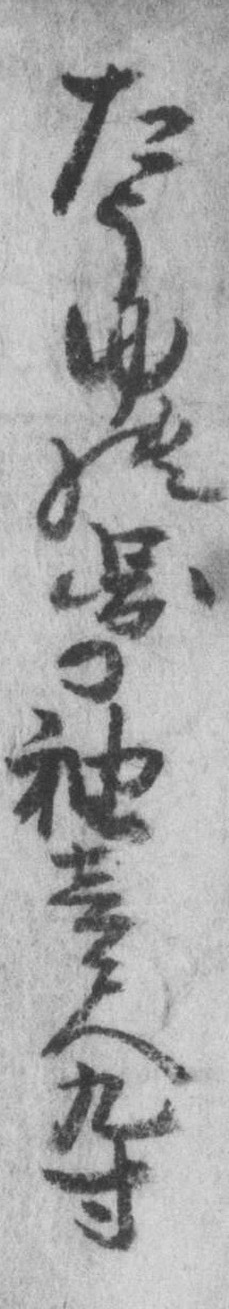たうゆの図○袖壱尺九寸
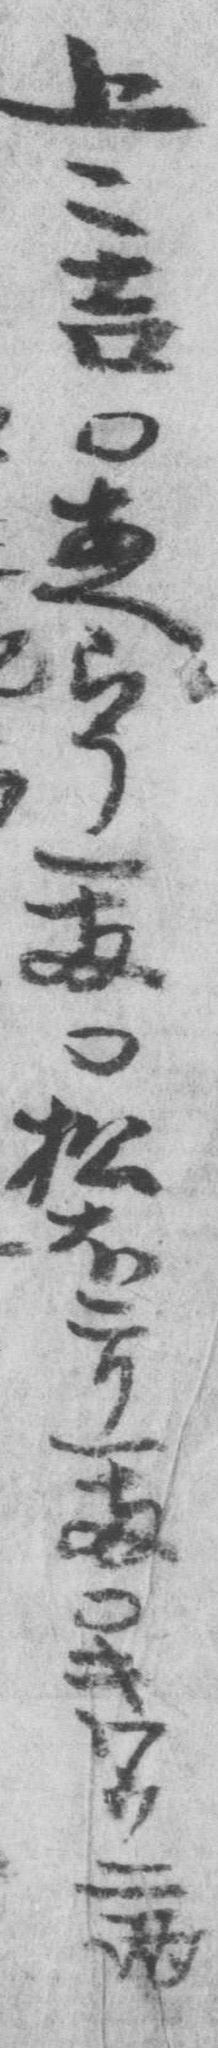上々吉○あへらう一両○松ほこり一両○キワウ二両
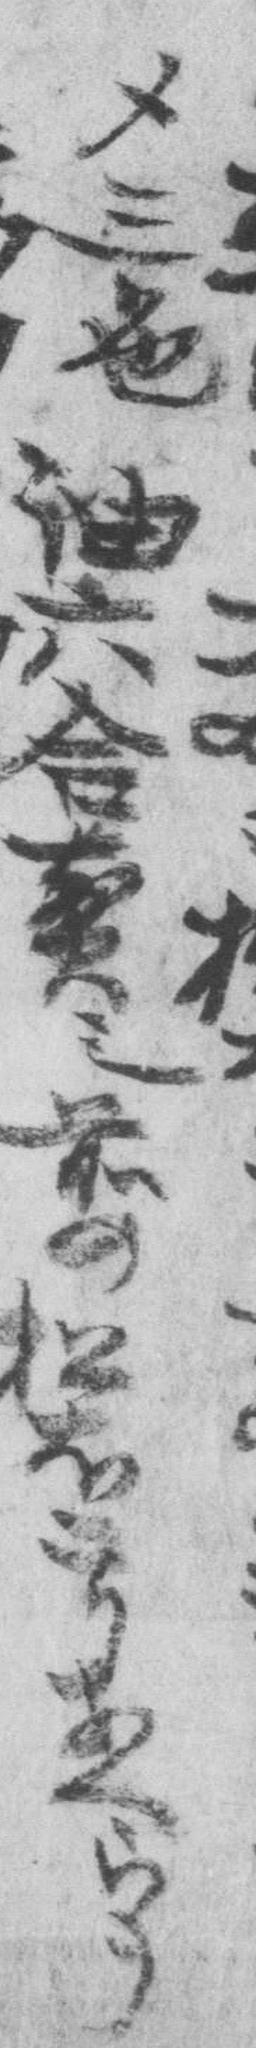〆三色油六合煎？し前の松ほこりあへらう
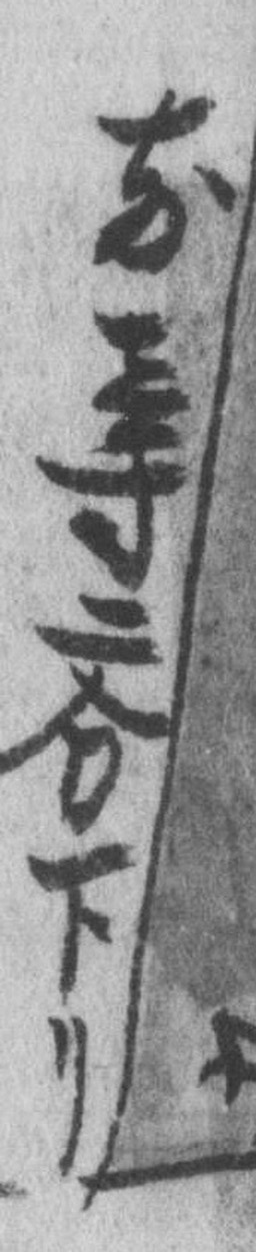前三寸二分下り
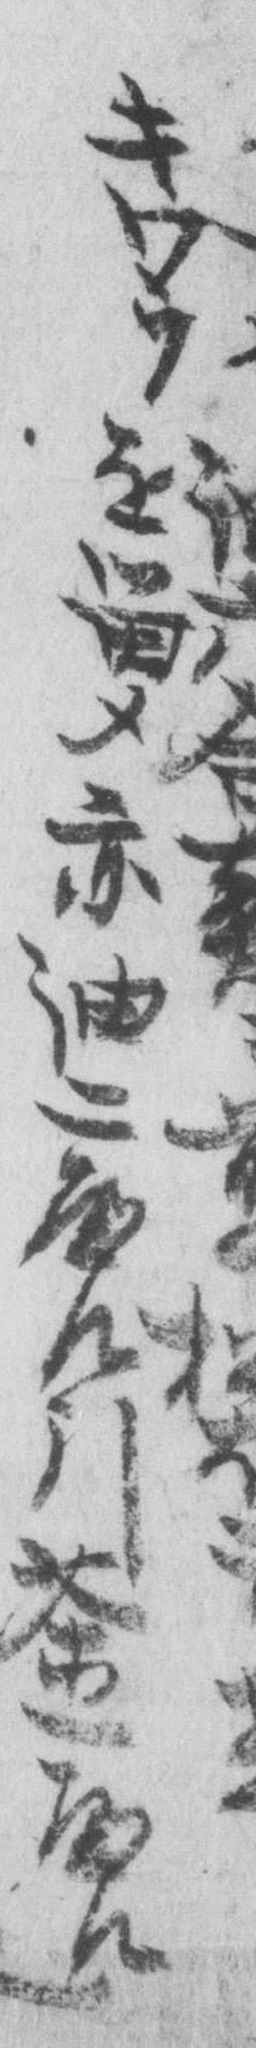キワウを留め亦油二へん引茶一へん
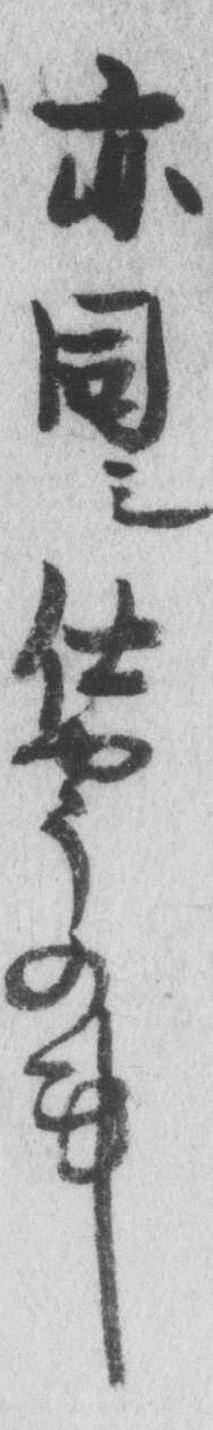亦同し仕やうの事
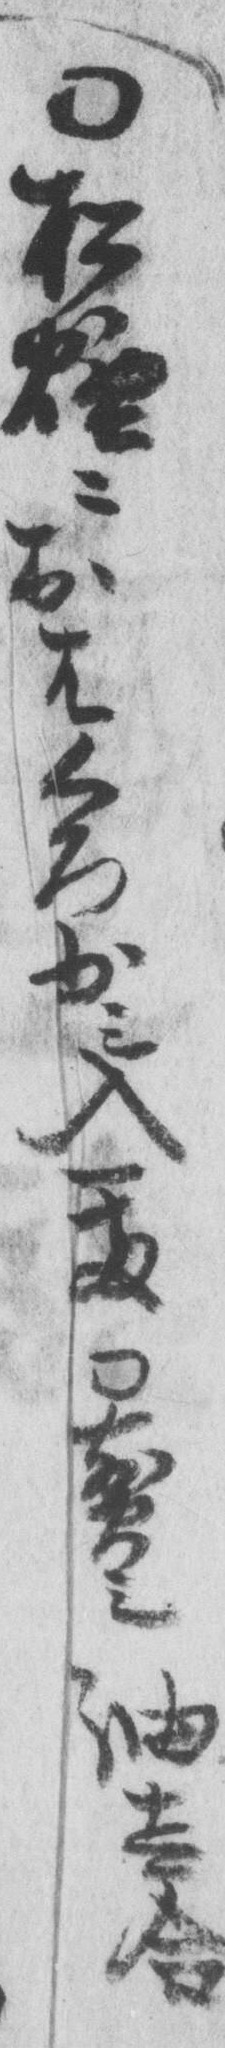○松煙におはくろ少し入一両○煎し油壱合
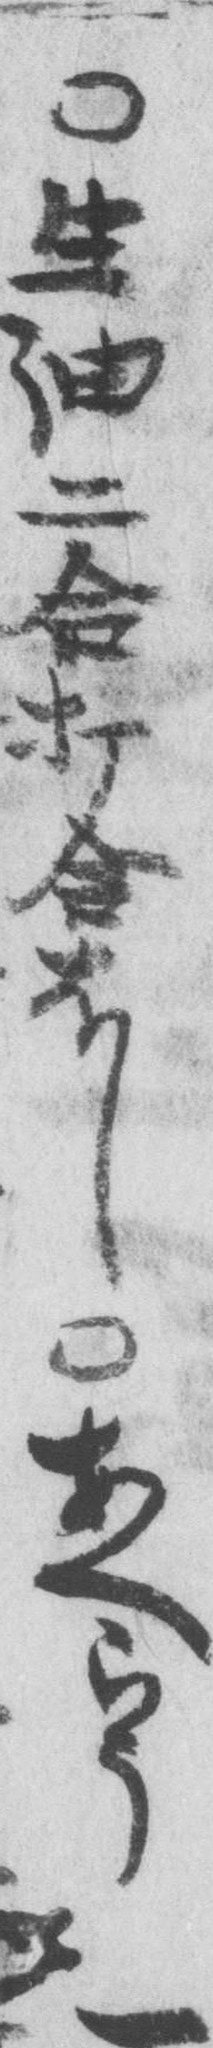○生油二合打合はし○あへらう一両
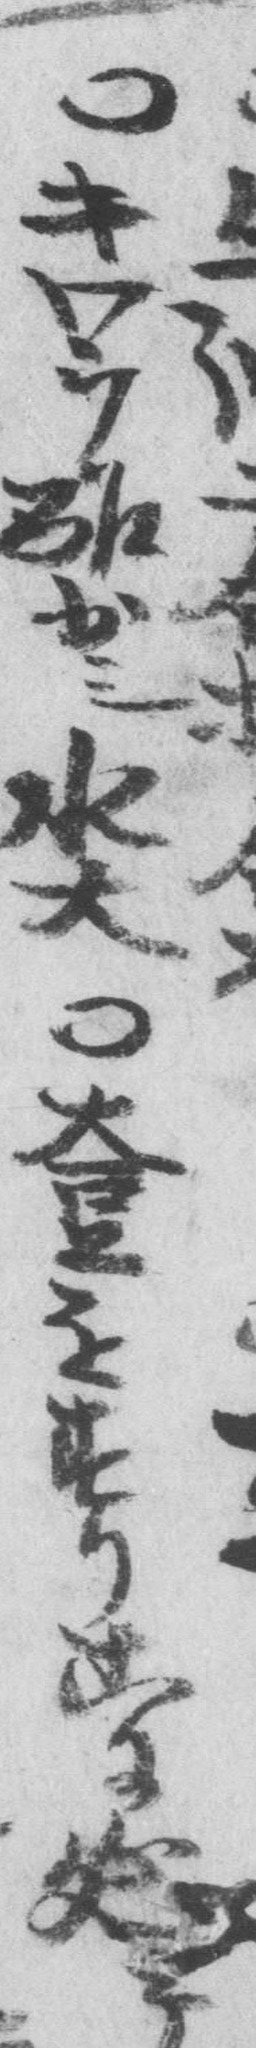○キワウ酢？少し水大○大豆をすりこにて
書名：御料理献立
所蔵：大阪府立大学学術情報センター 国文学研究資料館
